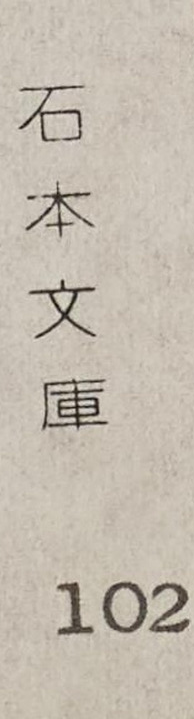石本文庫

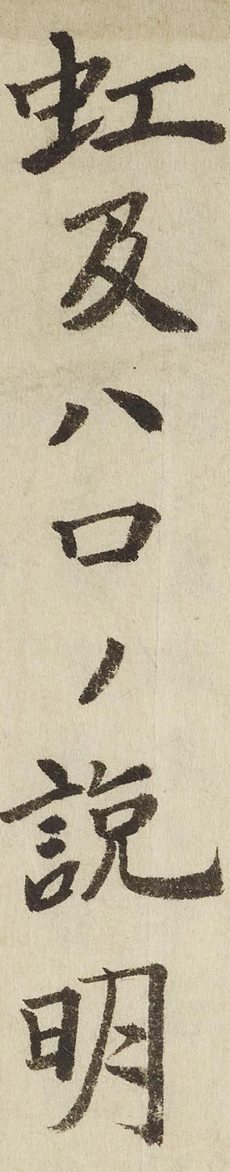虹及ハロノ説明

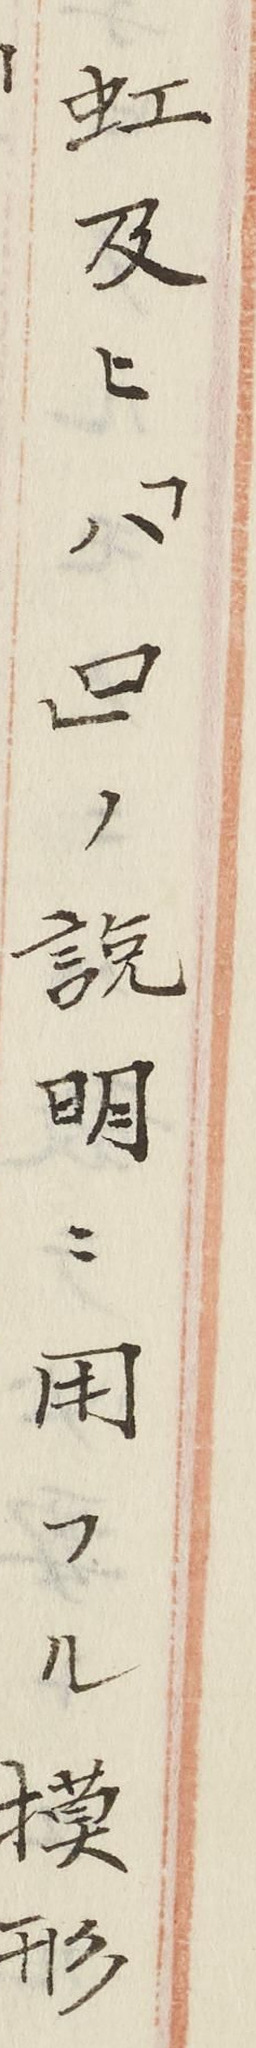虹及ヒ「ハロ」ノ説明ニ用フル摸形
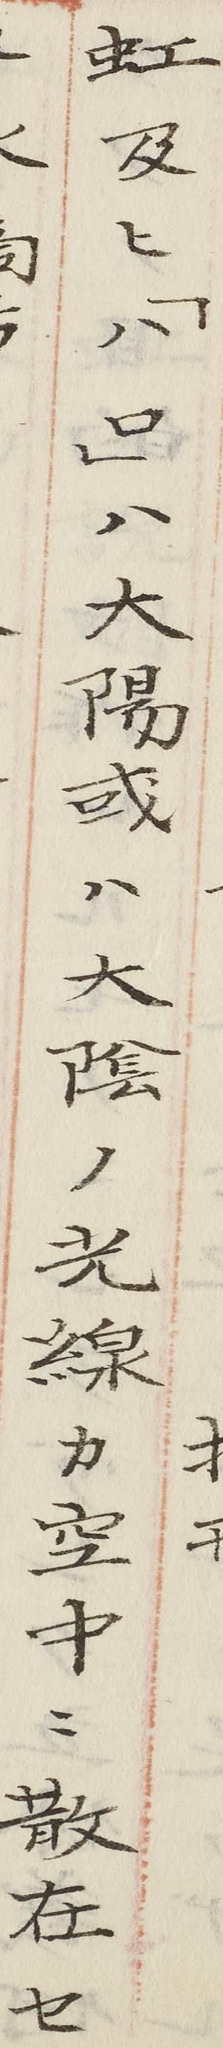虹及ヒ「ハロ」ハ大陽或ハ大陰ノ光線カ空中ニ散在セ
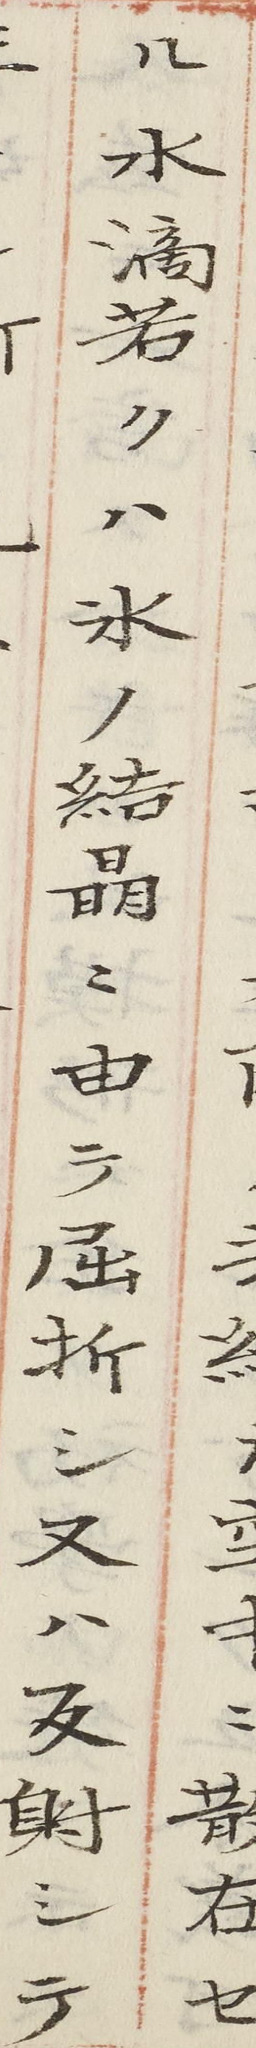ル水滴若クハ氷ノ結晶ニ由テ屈折シ又ハ反射シテ
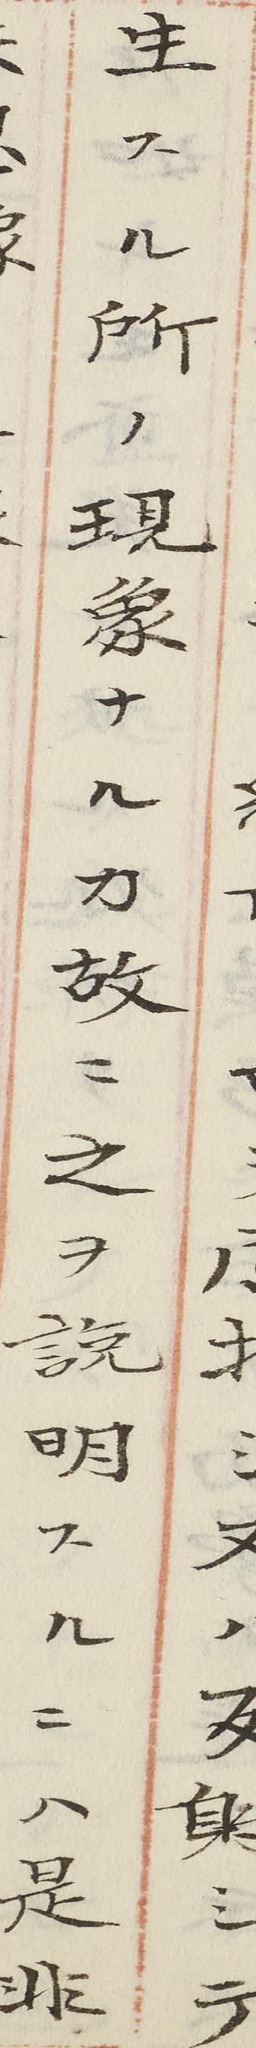生スル所ノ現象ナルカ故ニ之ヲ説明スルニハ是非
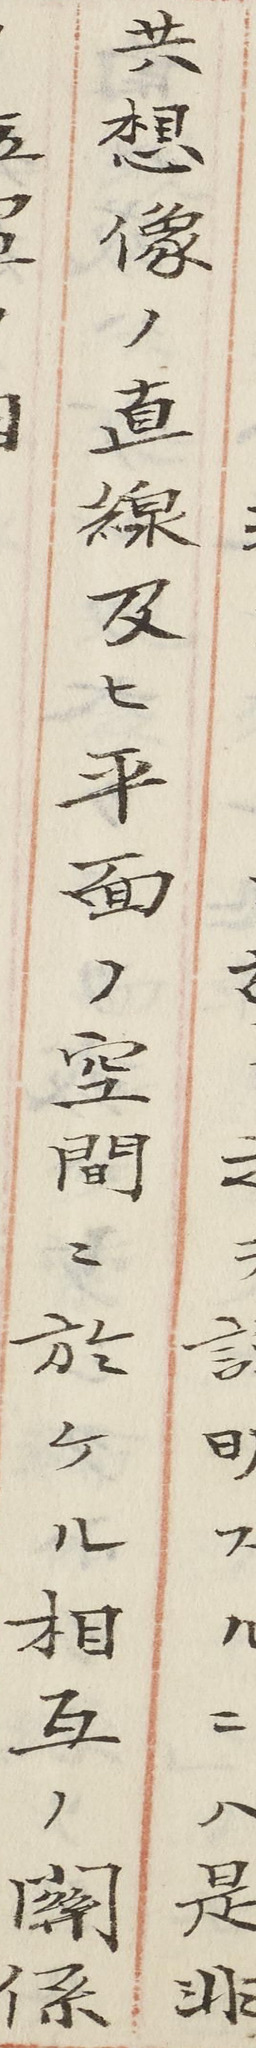共想像ノ直線及ヒ平面ノ空間ニ於ケル相互ノ関係
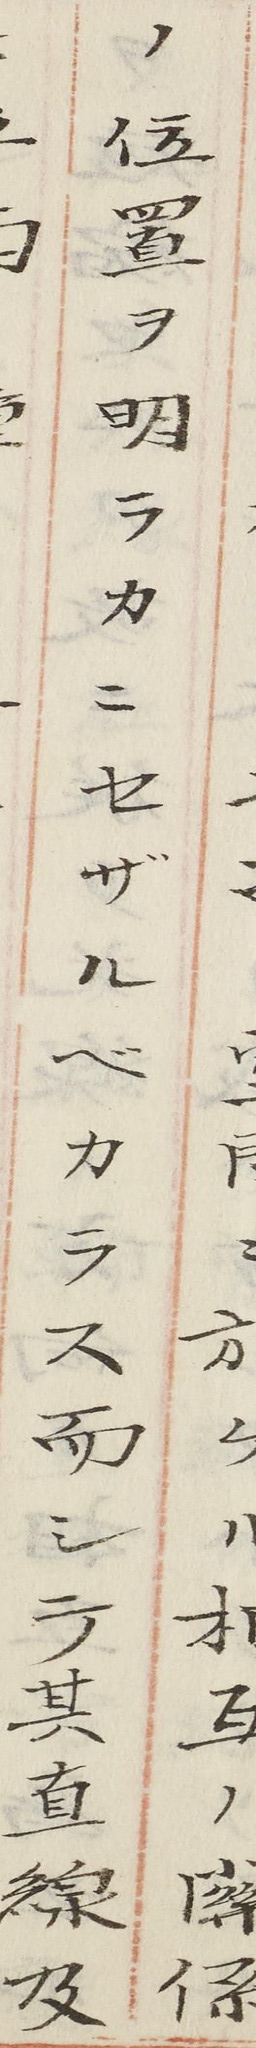ノ位置ヲ明ラカニセザルベカラス而シテ其直線及
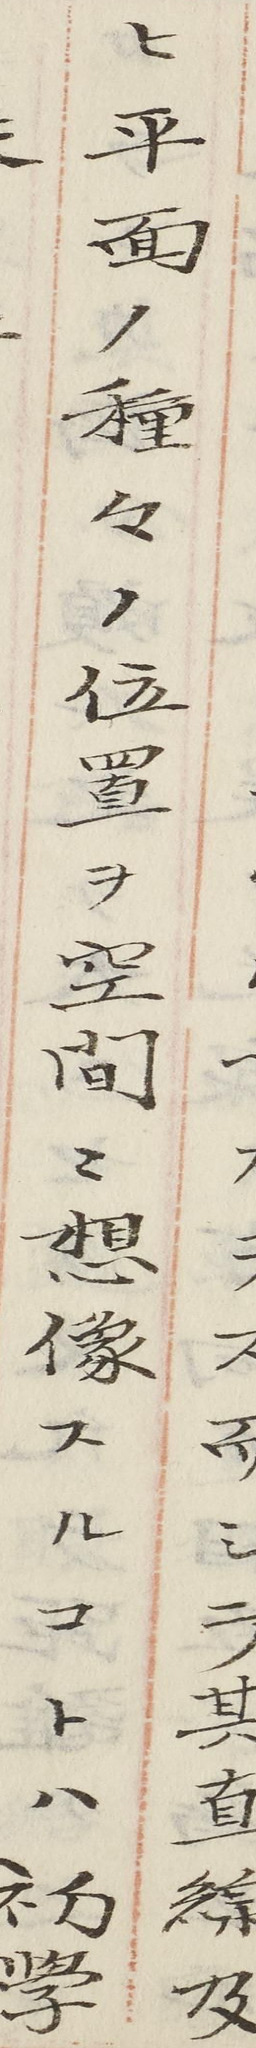ヒ平面ノ種々ノ位置ヲ空間ニ想像スルコトハ初学
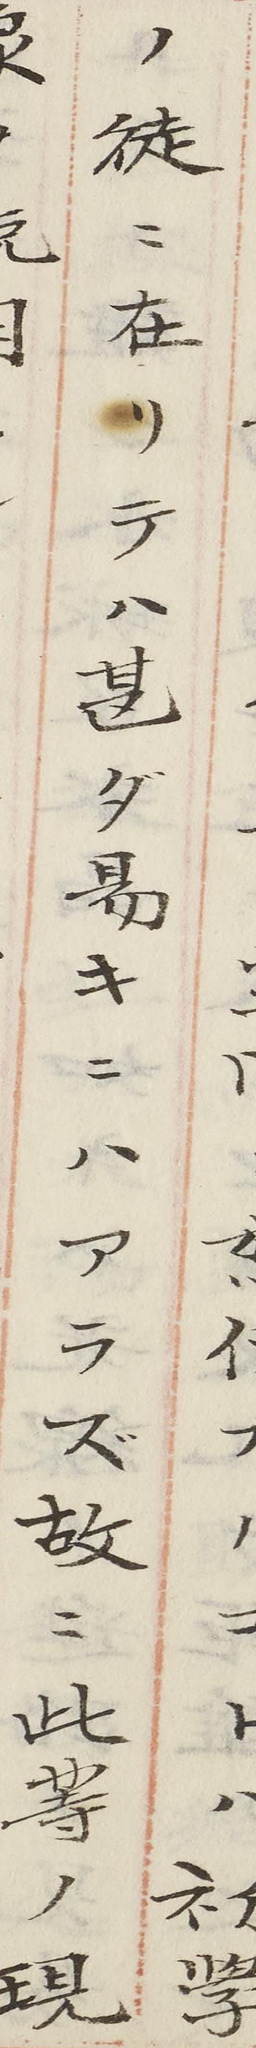ノ徒ニ在リテハ甚ダ易キニハアラズ故ニ此等ノ現
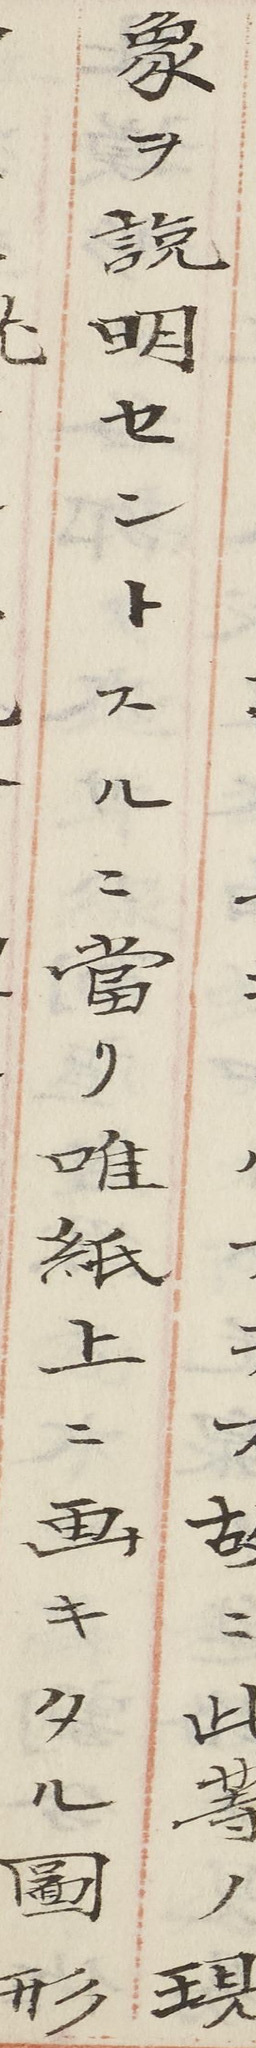象ヲ説明セントスルニ当リ唯紙上ニ画キタル図形
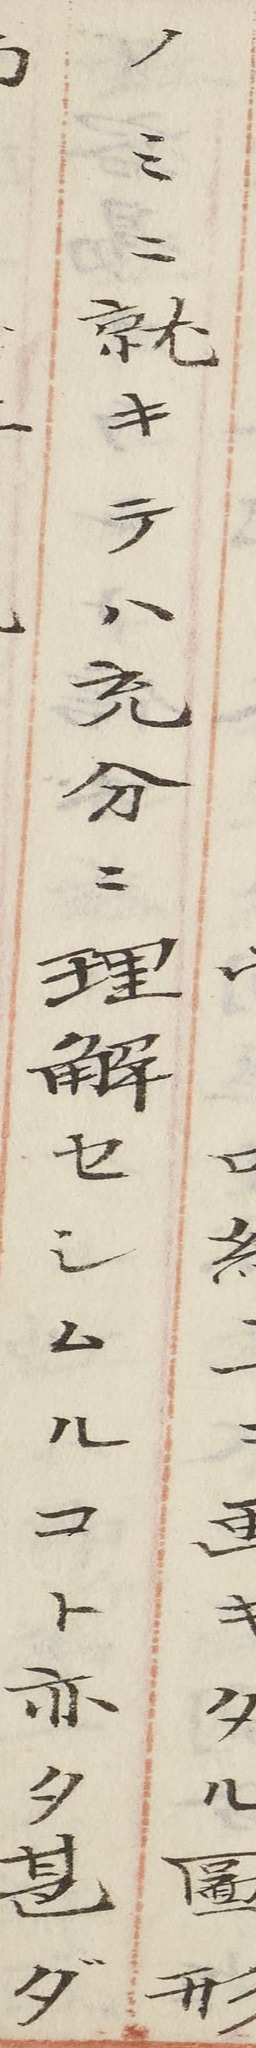ノミニ就キテハ充分ニ理解セシムルコト亦タ甚ダ
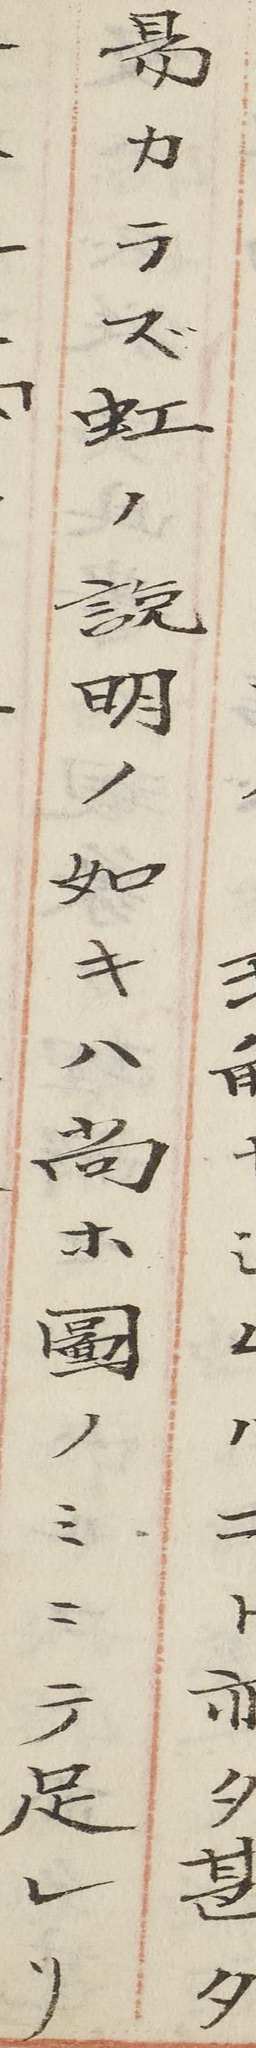易カラズ虹ノ説明ノ如キハ尚ホ図ノミニテ足レリ
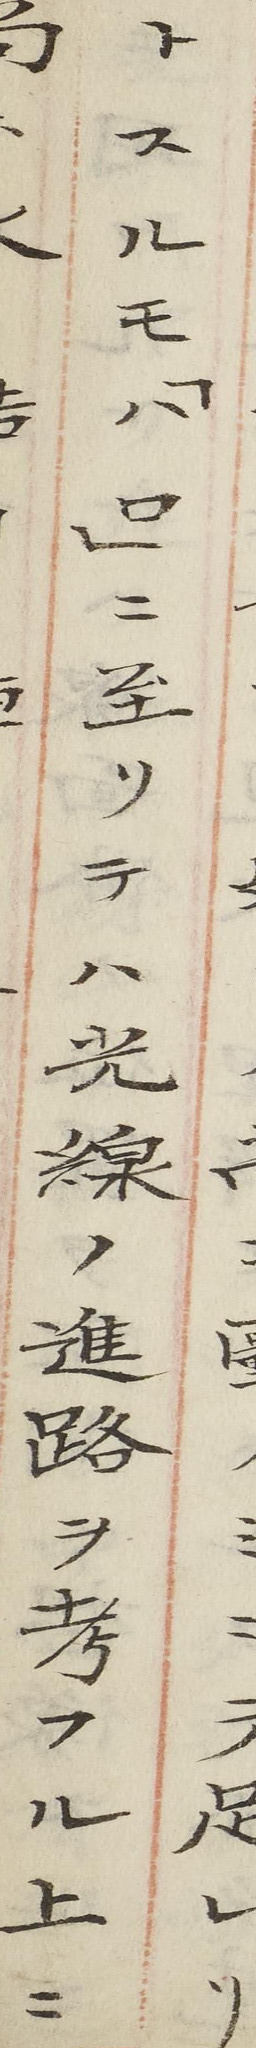トスルモ「ハロ」ニ至リテハ光線ノ進路ヲ考フル上ニ
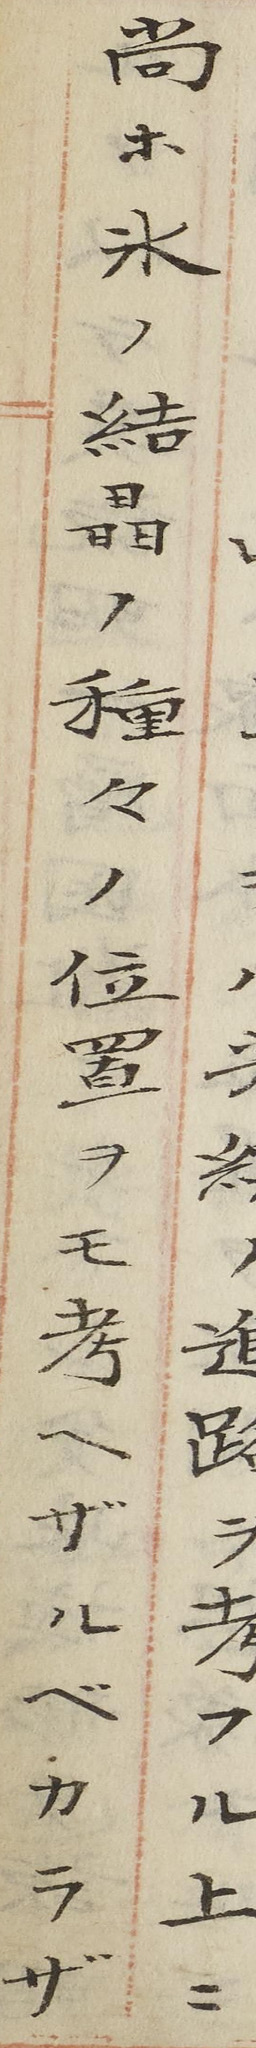尚ホ氷ノ結晶ノ種々ノ位置ヲモ考ヘザルベカラザ

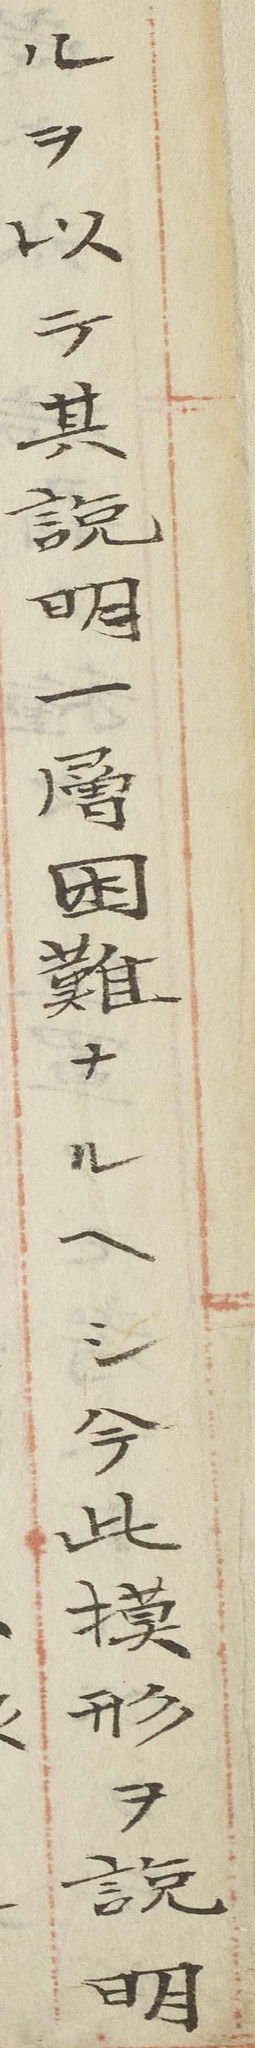ルヲ以テ其説明一層困難ナルヘシ今此摸形ヲ説明
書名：虹及ハロノ説明
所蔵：東京大学地震研究所図書室 Earthquake Research Institute Library, The University of Tokyo, JAPAN
